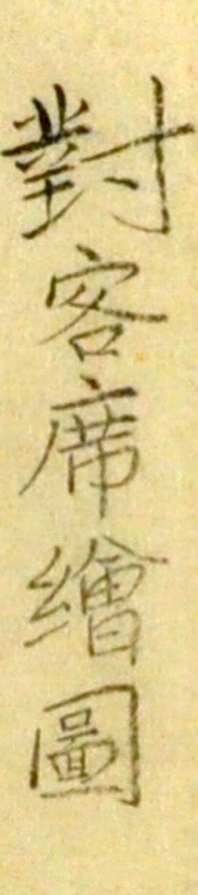対客席絵図

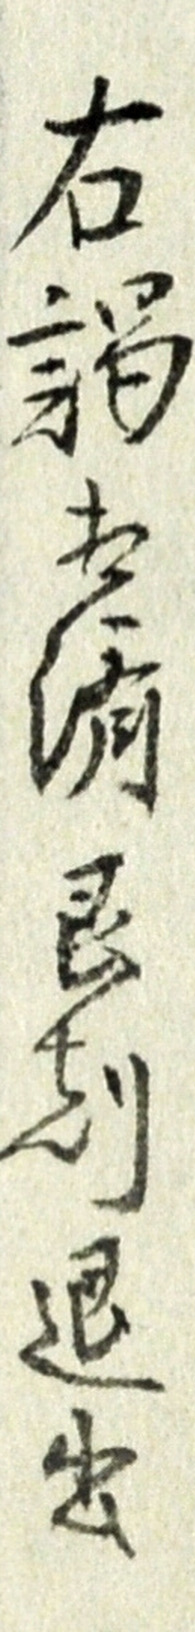右謁相済艮刻退出
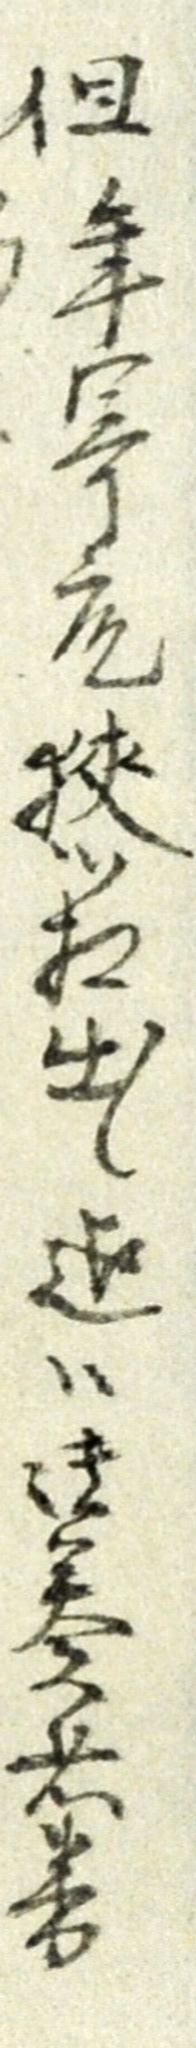但年寄衆挟箱出候迄ハ御奏者番
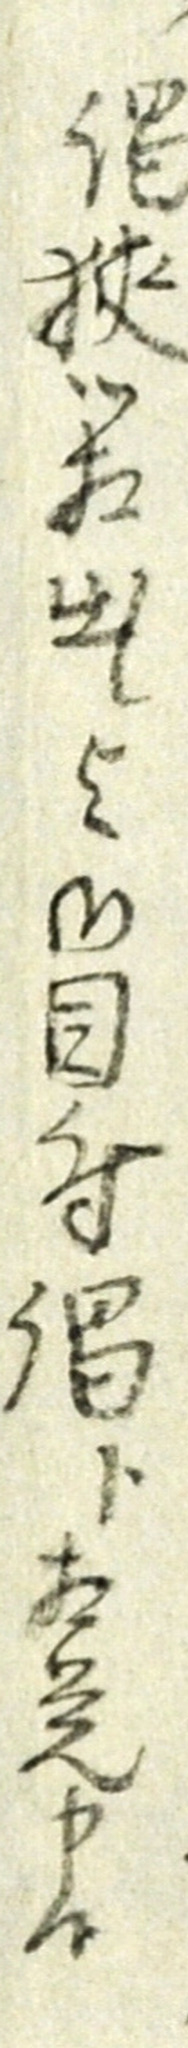謁挟箱出候と御目付謁と相覚申候
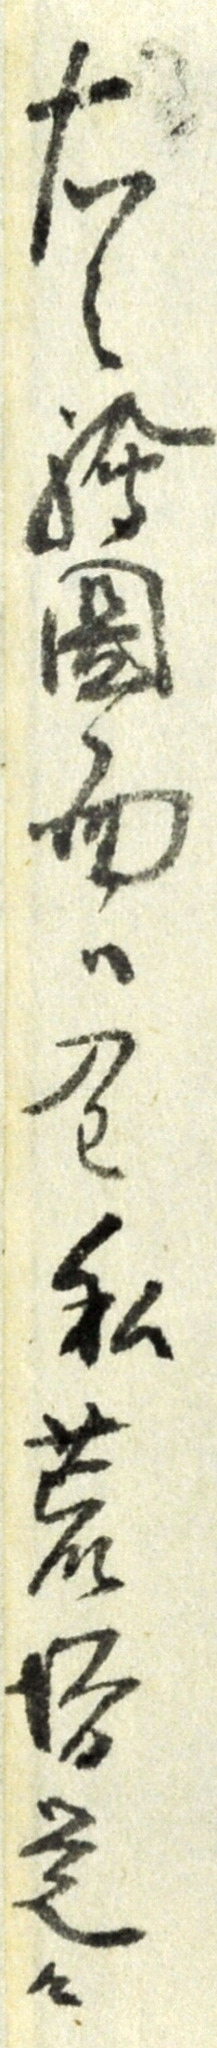右之絵図面ハ全私荒増覚候
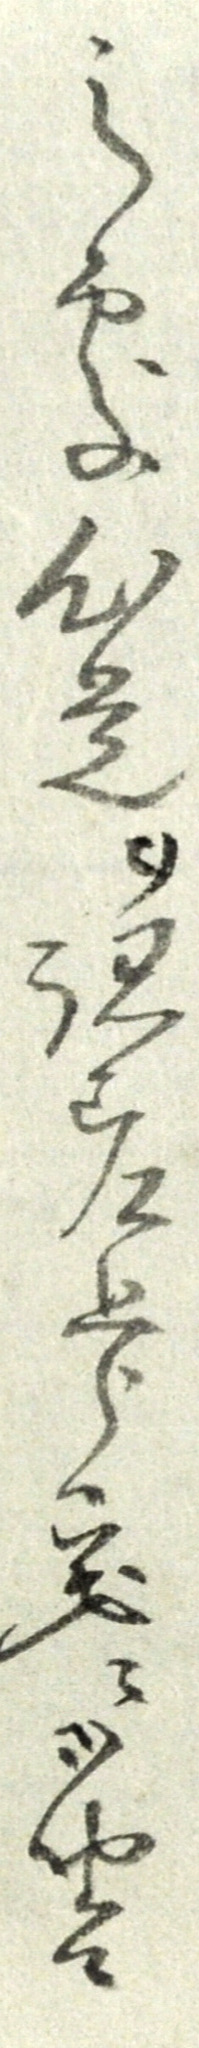之処心覚ヲ認差上申候義ニ御座候

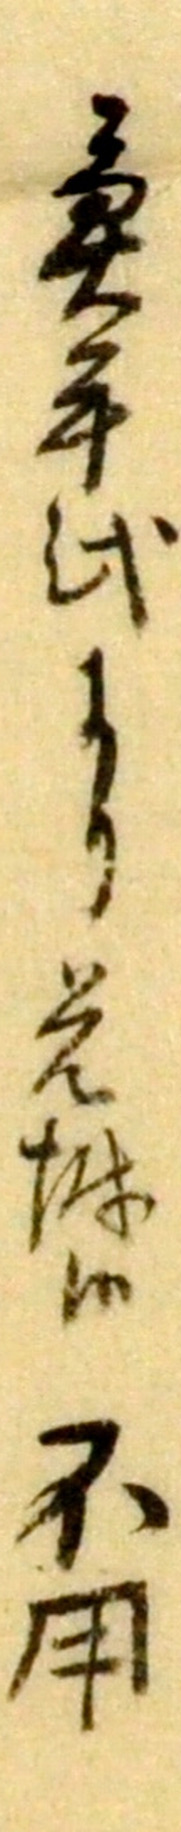奥平氏より差越候不用
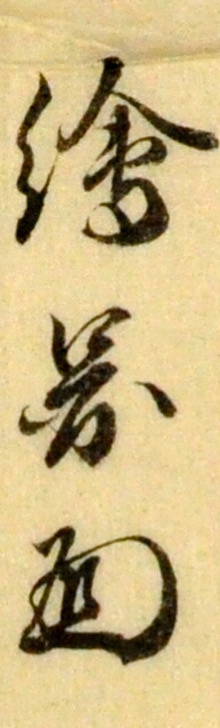絵図面

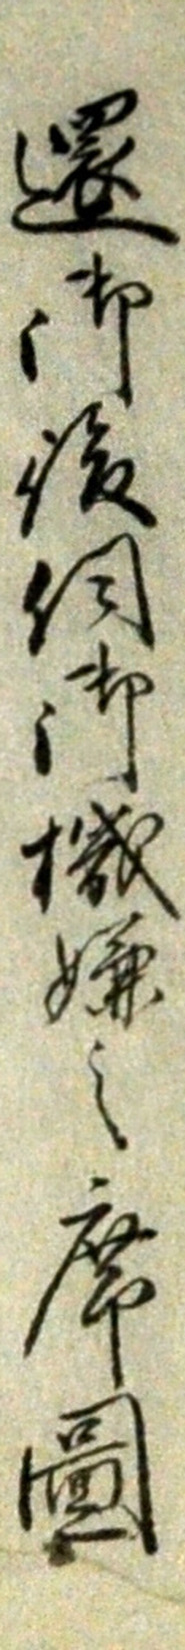還御後伺御機嫌之席図
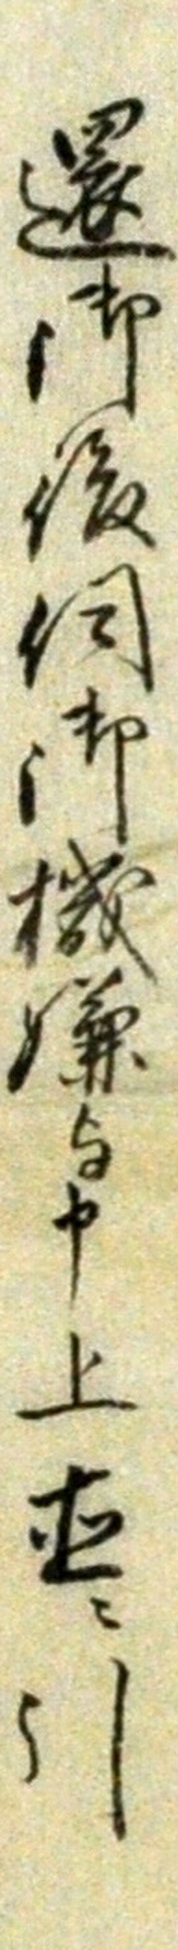還御後伺御機嫌旨申上直ニ引

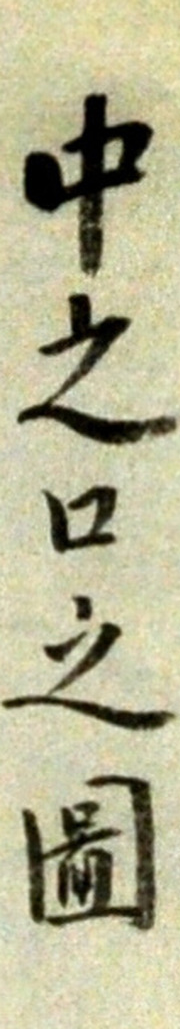中之口之図
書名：諸絵図面〔一括〕
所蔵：伊那市立高遠町図書館・合同会社AMANE
